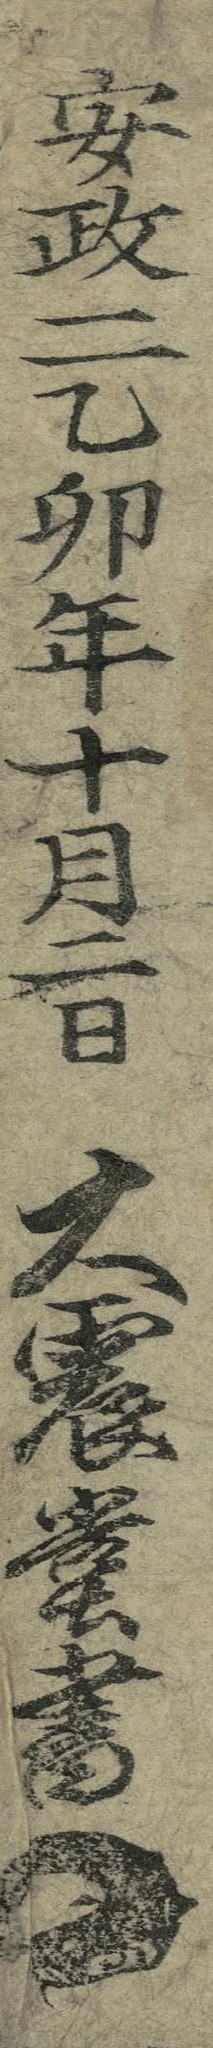安政二乙卯年十月二日大震堂書
